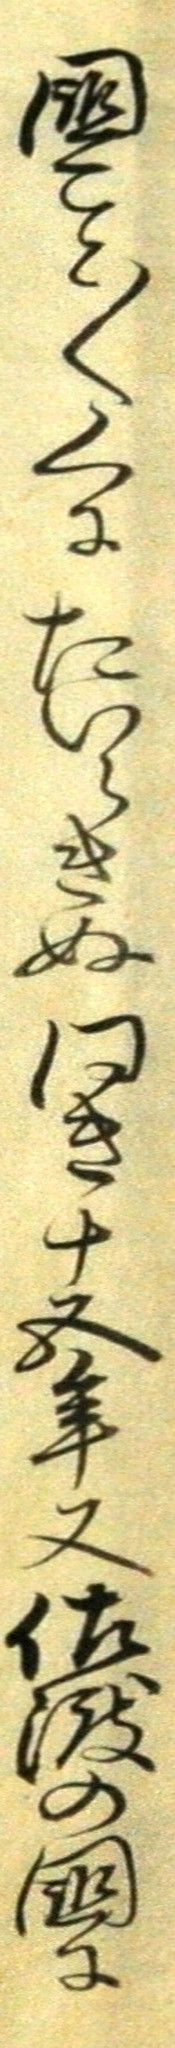国こと〳〵くにたいらきぬ同き十五年又佐渡の国に
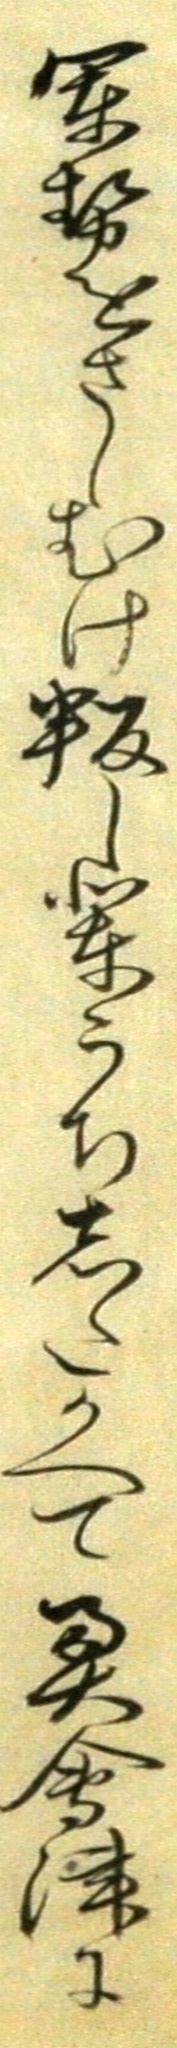軍勢をさしむけ叛し輩うちしたかへて奥会津に
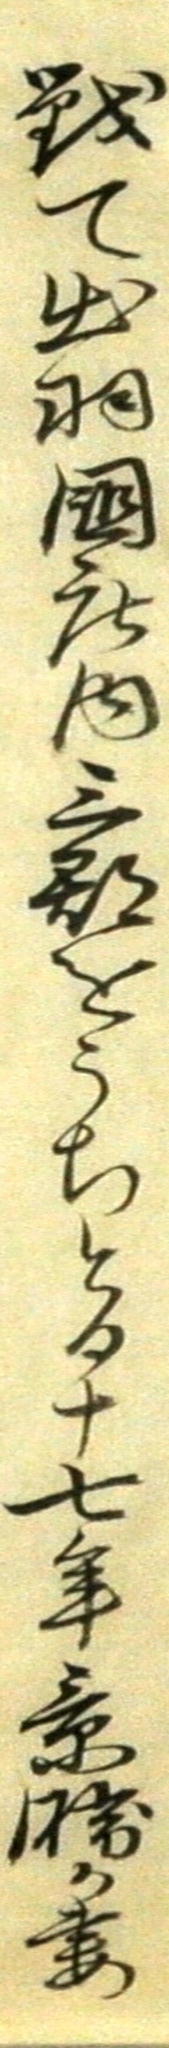戦て出羽国庄内三郡をうちとる十七年景勝か妻
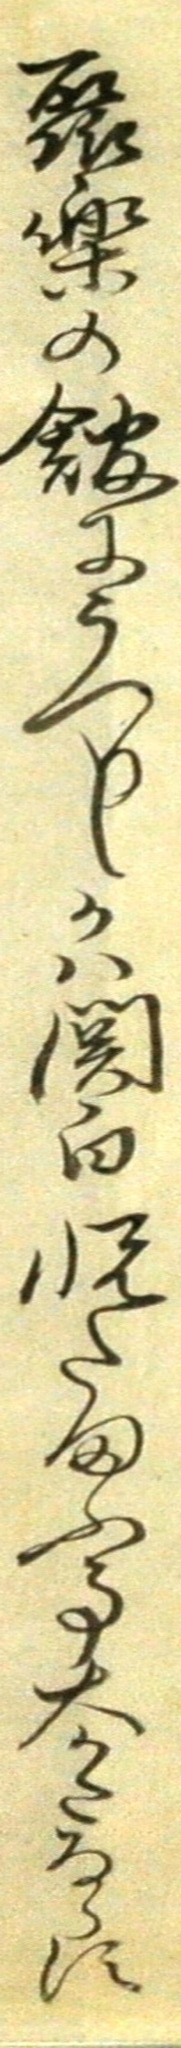聚楽の館にうつりしかは関白悦たまふ事大かたならす
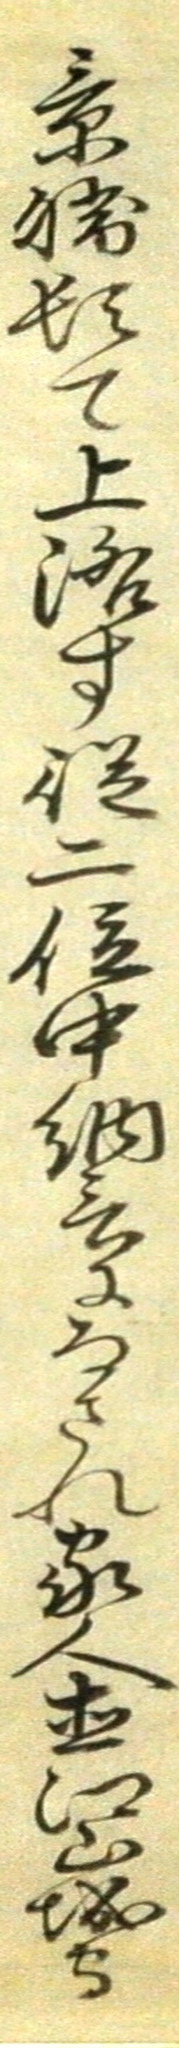景勝頓て上洛す従二位中納言になされ家人直江山城守
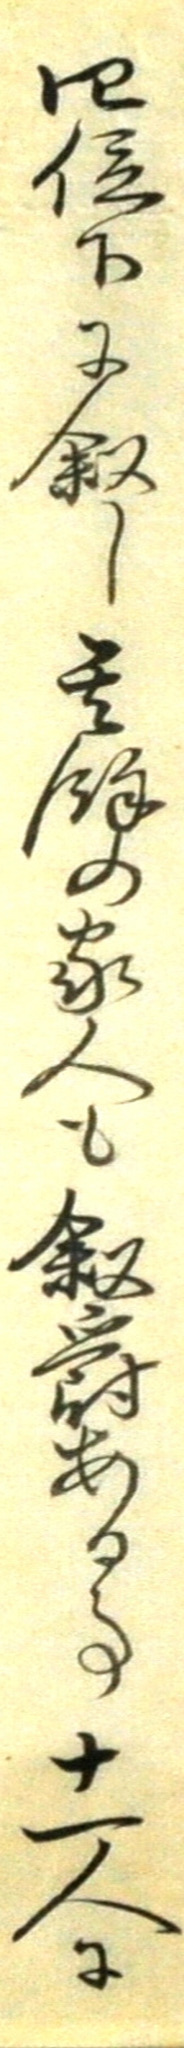四位下に叙し其余の家人も叙爵ある事十一人に
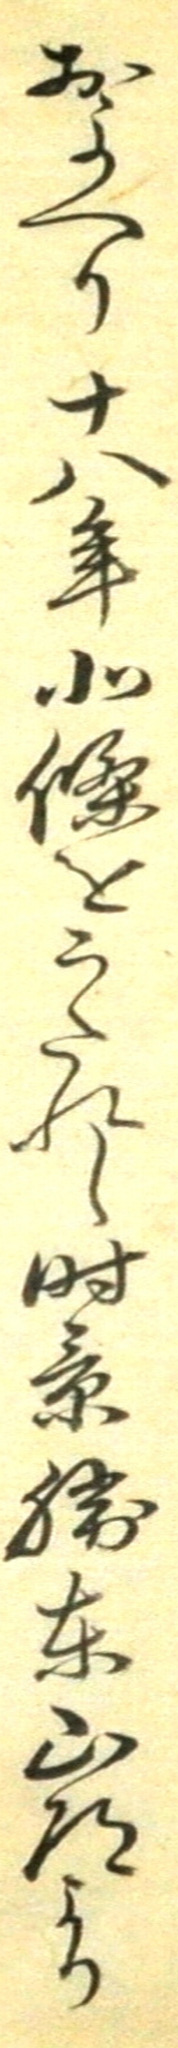およへり十八年北条をうたれし時景勝東山道より
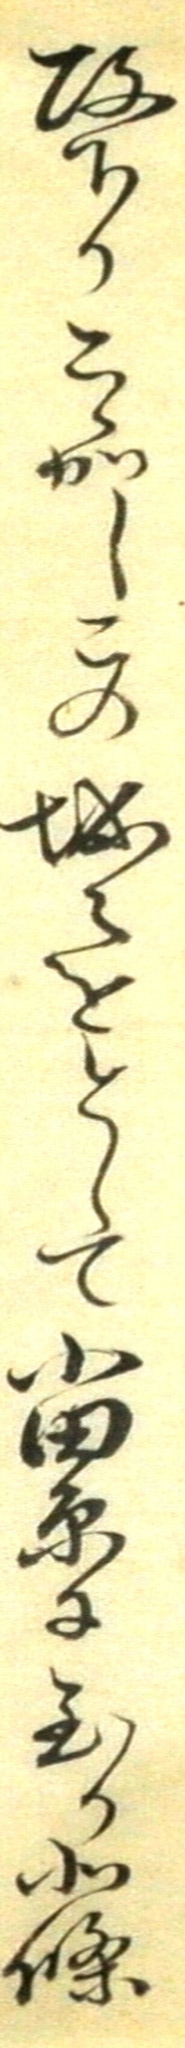攻下りこゝかしこの城々をとして小田原に至り北条
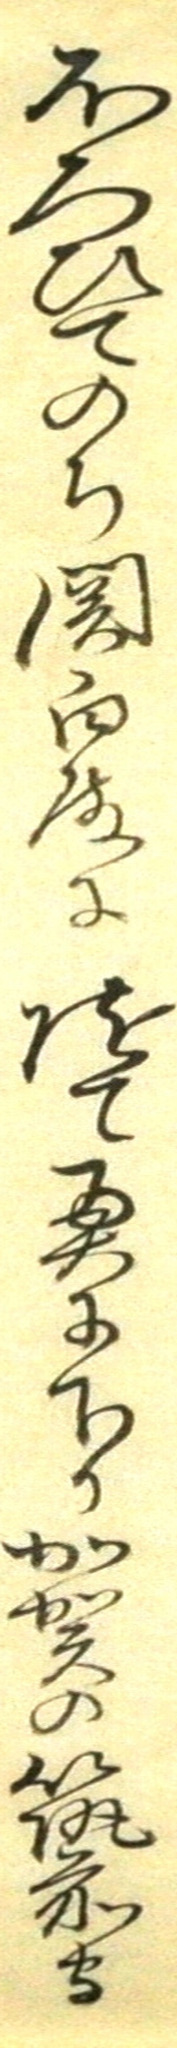ほろひてのち関白殿に随て奥に下り加賀の筑前守
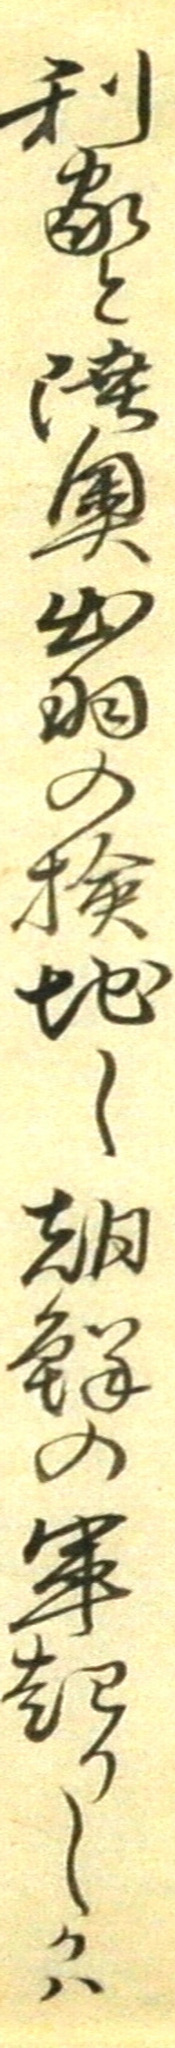利家と陸奥出羽の検地し朝鮮の軍起りしかは
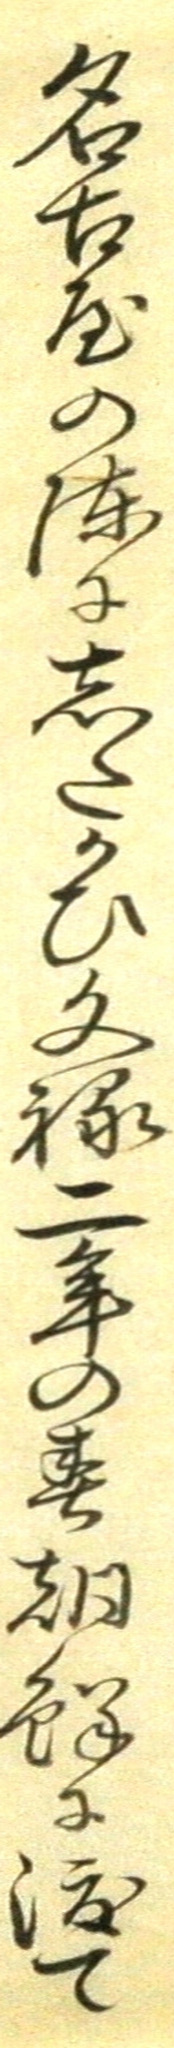名古屋の陣にしたかひ文禄二年の春朝鮮に渡て
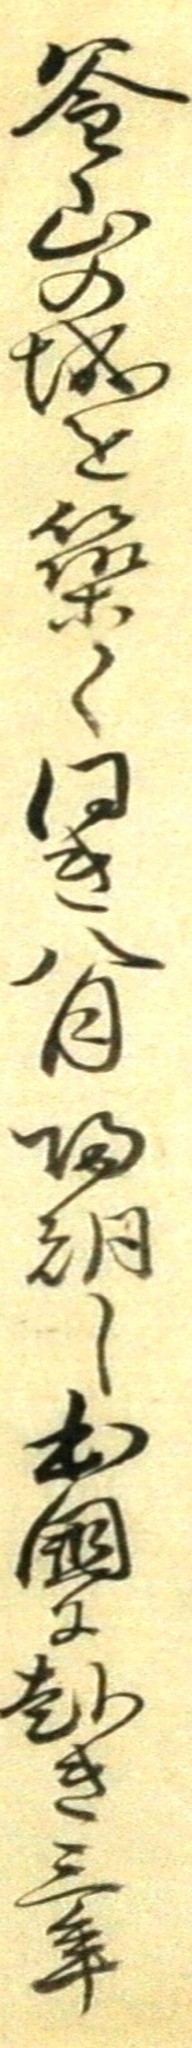釜山の城を築く同き八月帰朝し本国に赴き三年
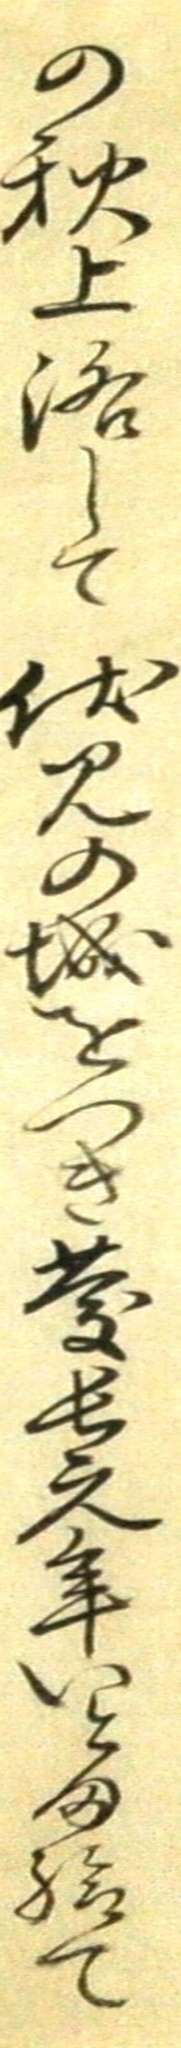の秋上洛して伏見の城をつき慶長元年いとま給て
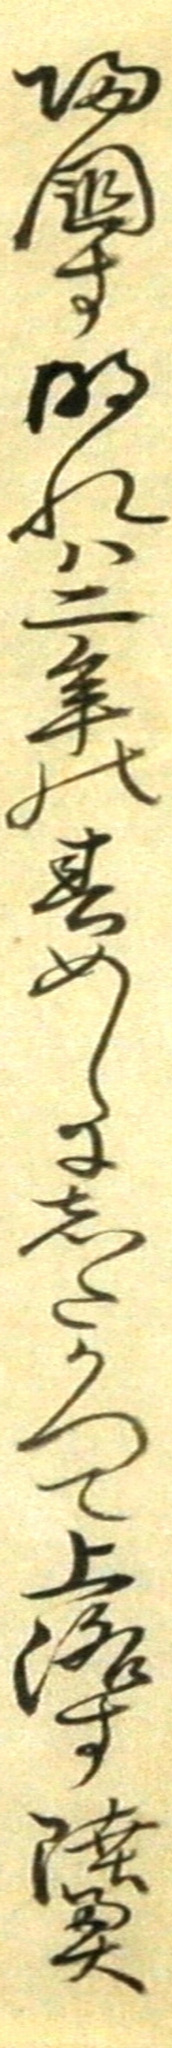帰国す明れは二年の春めしにしたかつて上洛す陸奥

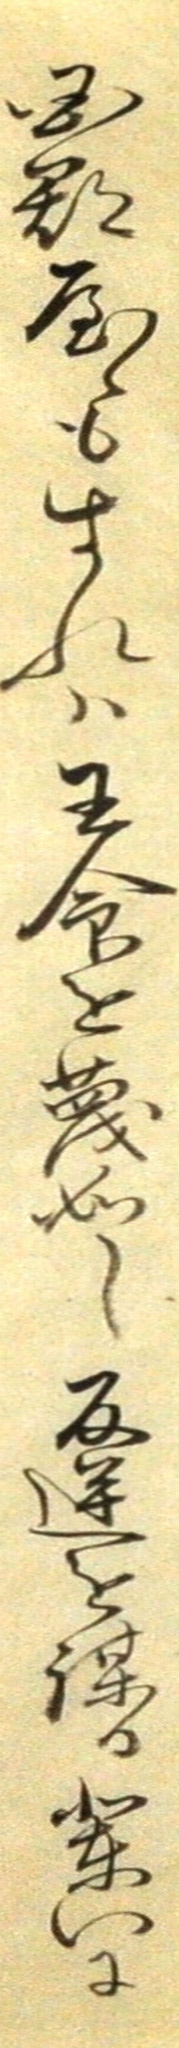国郡やゝもすれは王命を蔑如し反逆を謀る輩いに
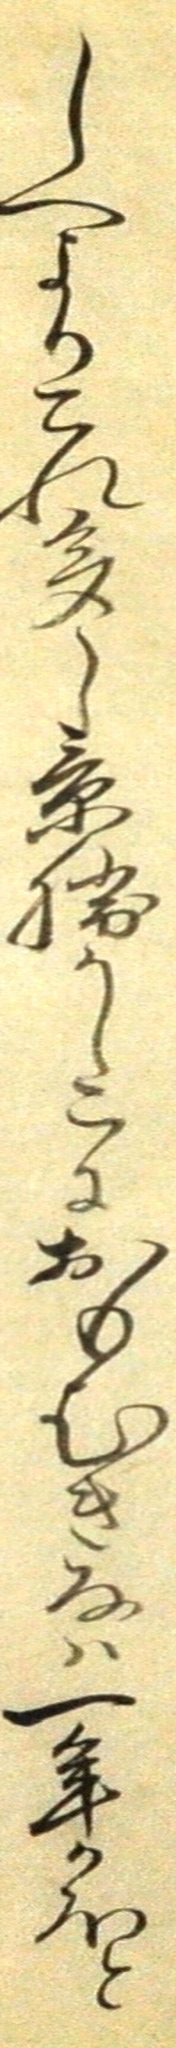しへよりこれ多し景勝かしこにおもむきなは一年かほと
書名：藩翰譜（八・下）
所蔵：伊那市立高遠町図書館・合同会社AMANE
